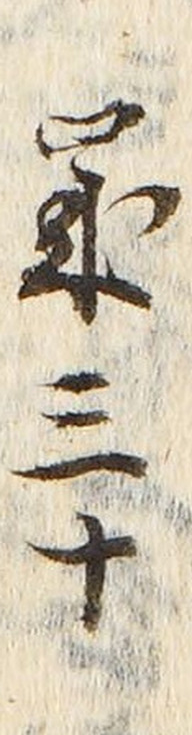歳三十
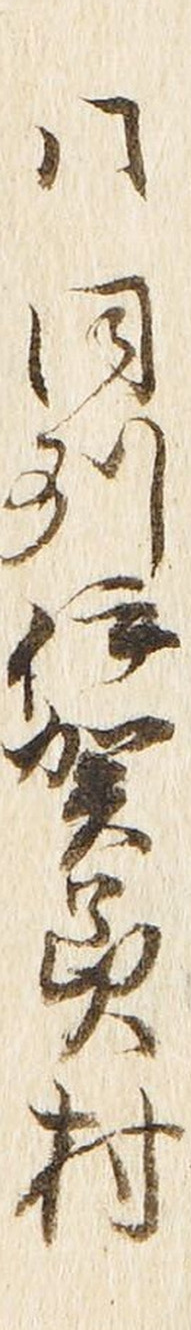同同州伊賀美村
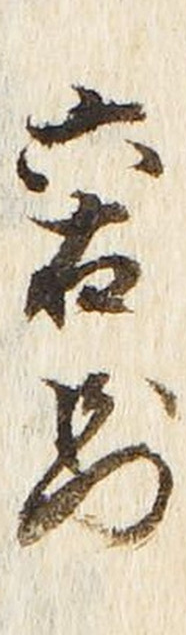六右衛門
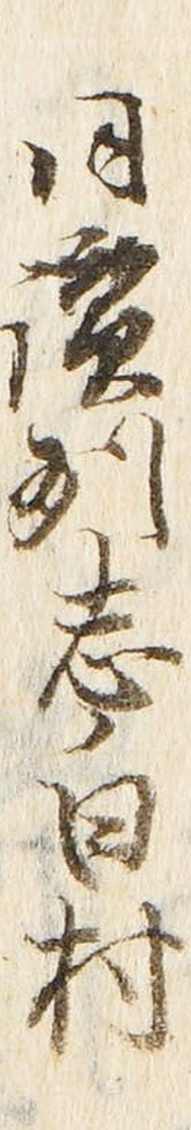同讃州志白村
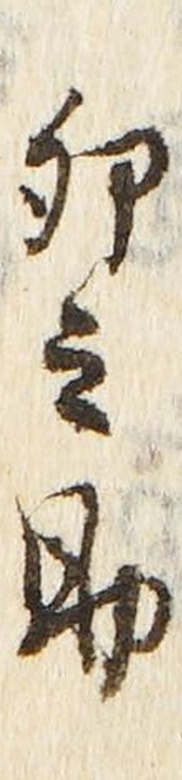卯之助
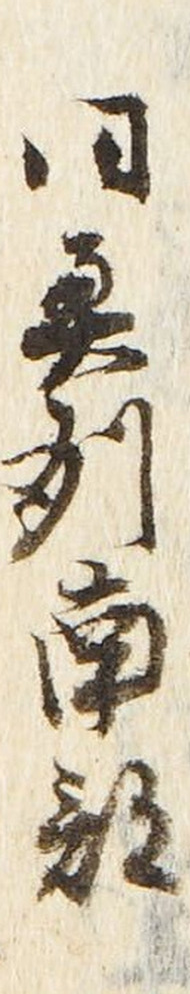同奥州南部
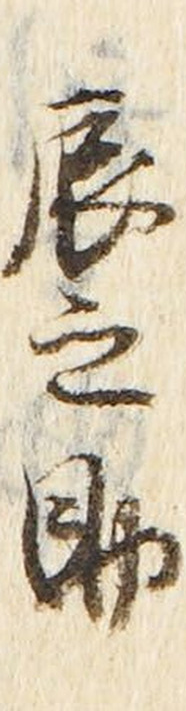辰之助
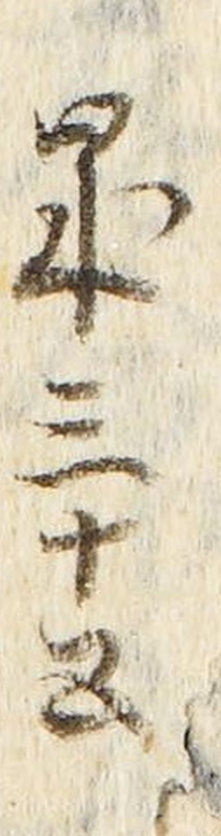歳三十五

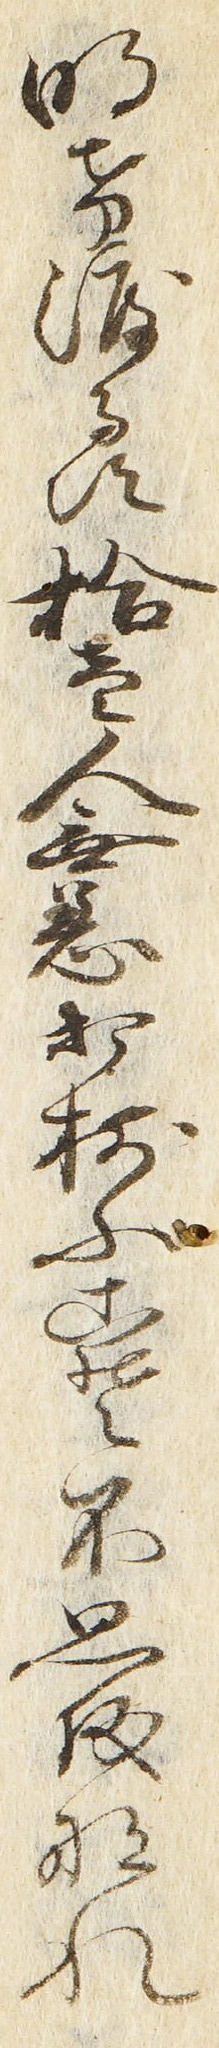明け渡る頃拾壱人無恙打揃ふこそ不思儀なれ
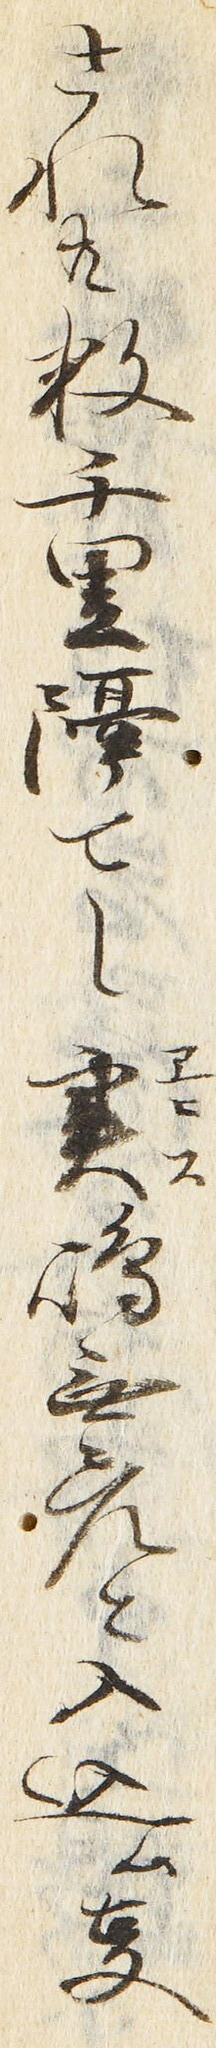され共数千里隔てし夷島無差と入込ム事
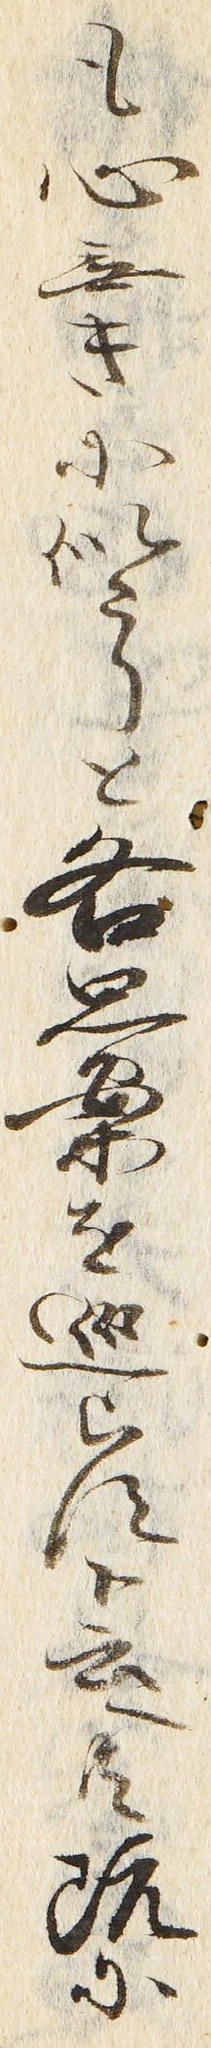も心無に似たりと各思案を巡らすト云へ共既に
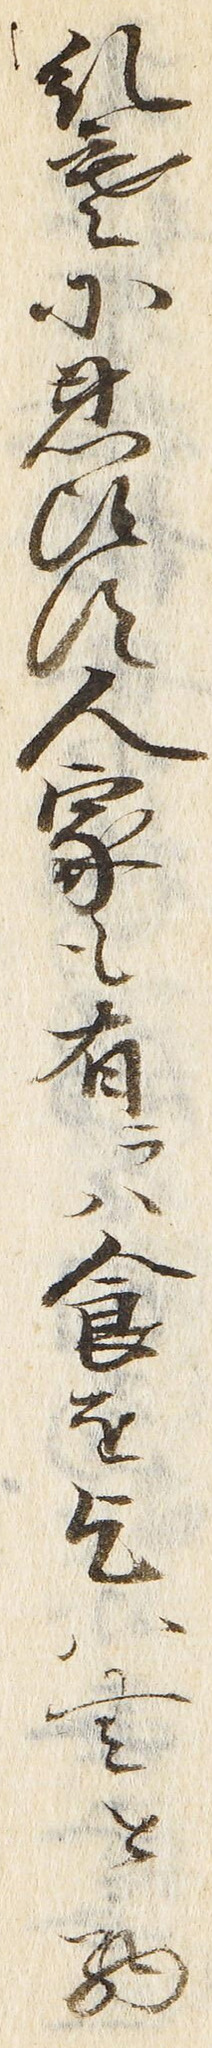糺寒に忍ひす人家も有ハ食を乞はむと西
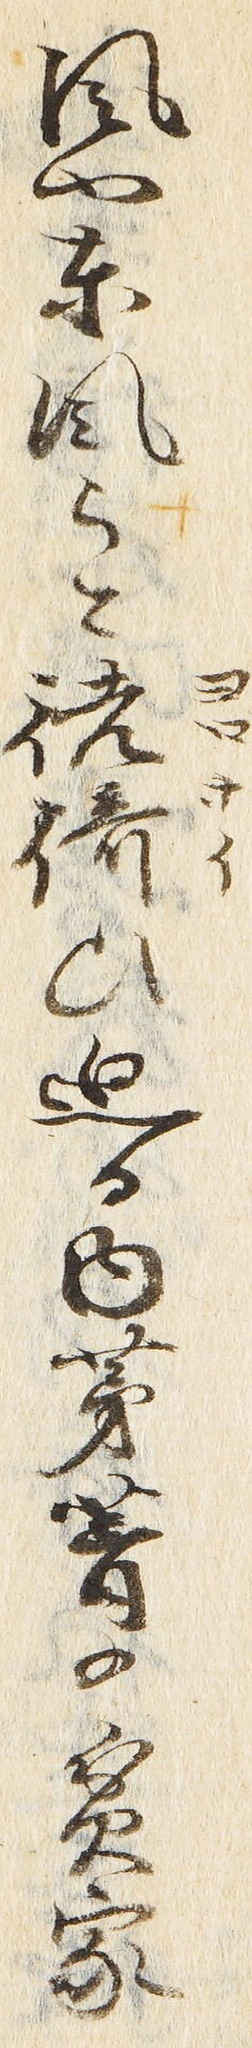風や東風らと諸倚ひ迫る内茅葺の軒
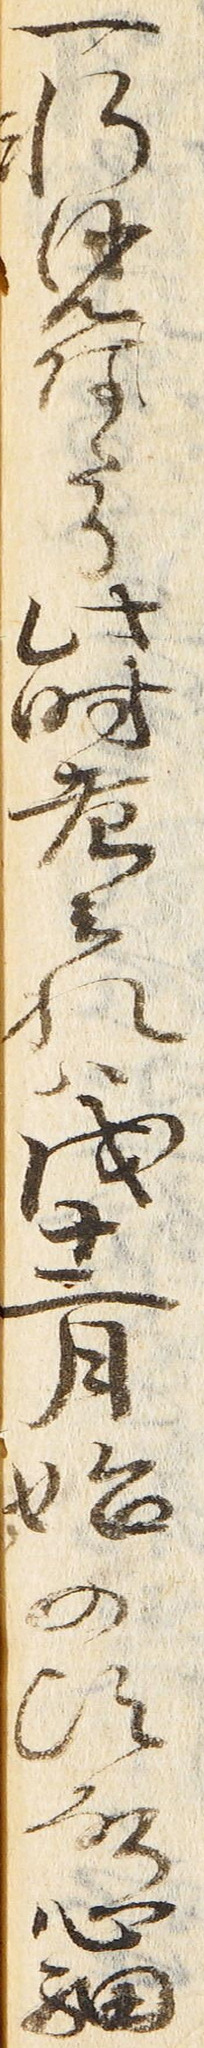一軒見付たり此時考みれは戊十二月始の頃なり心細
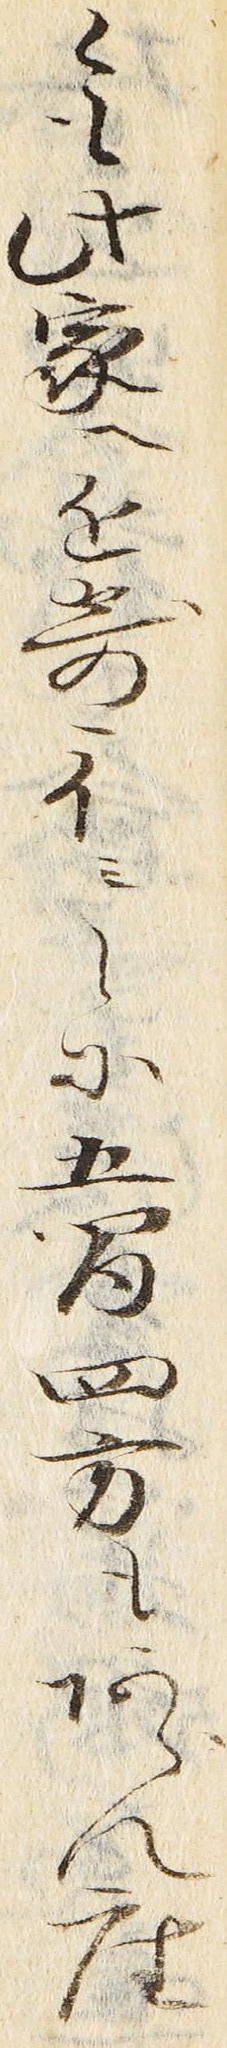くも此家へ近寄彳みしに五間四方もあらん座
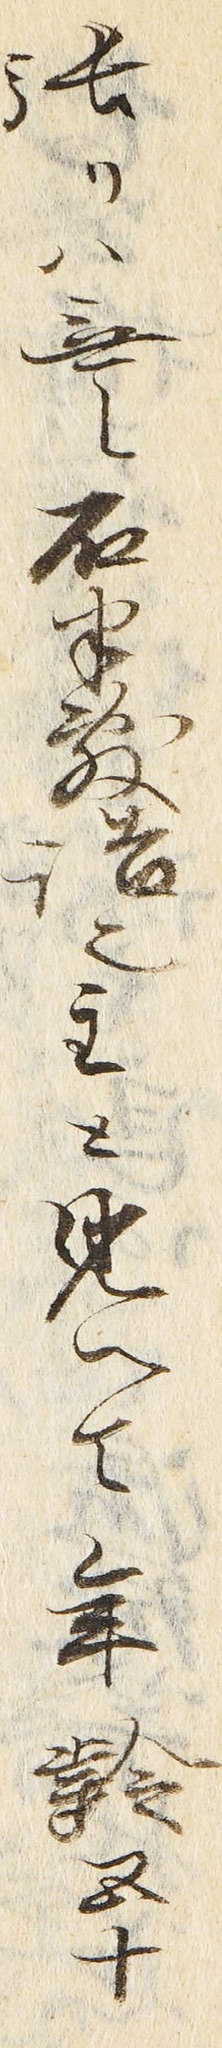張りは無し石半敷詰也主と見へて年齢五十
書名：唐物語
